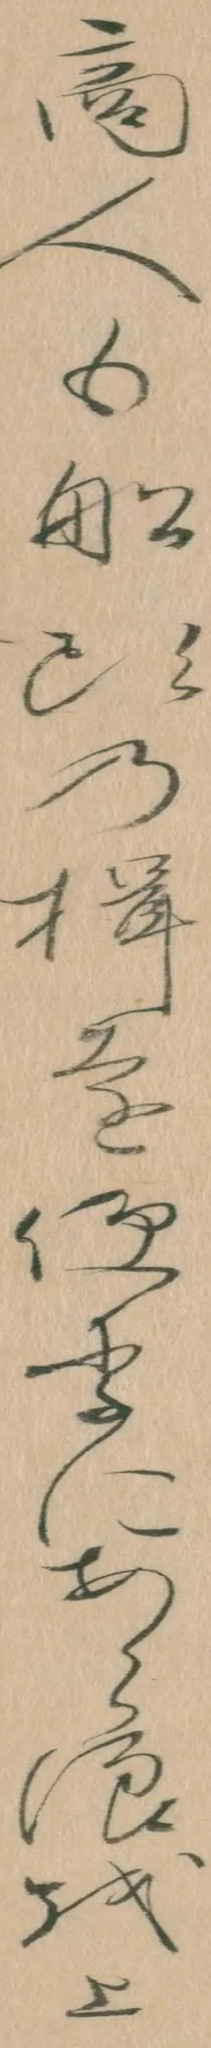商人も船頭の様を便りにあら浪を上

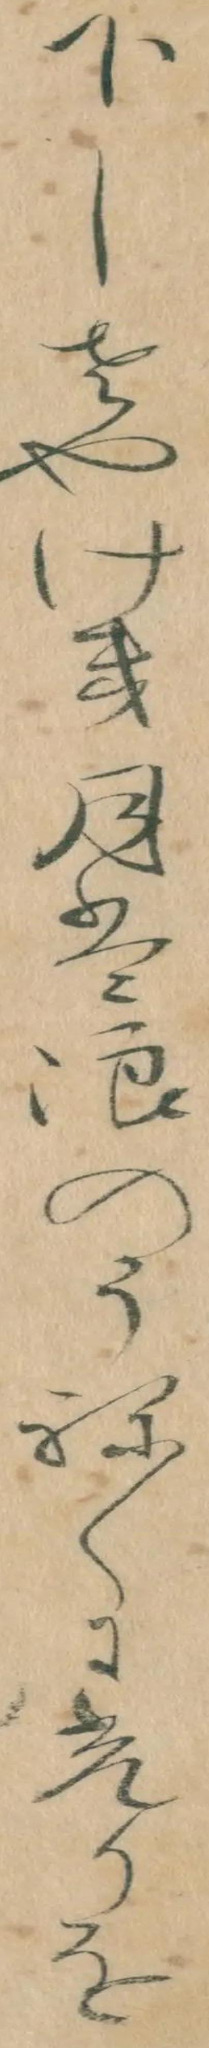下しをやけき月は浪のうね〳〵に光りを
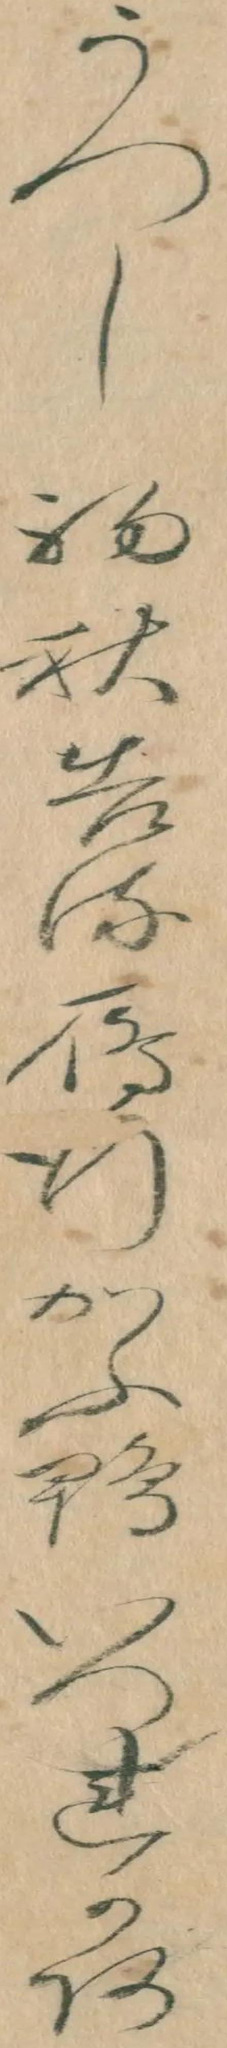うつし初秋告る雁行かふ鴨いつれかあ
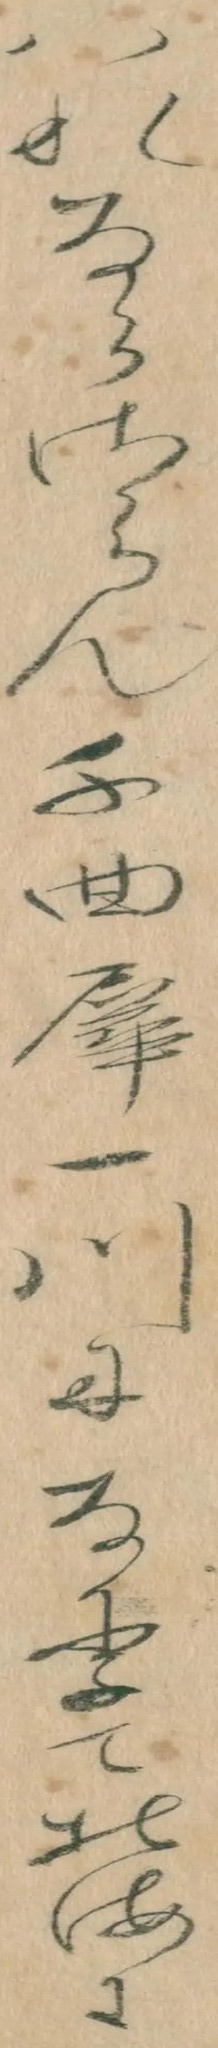はれならさらん千曲犀一川になりて北海に
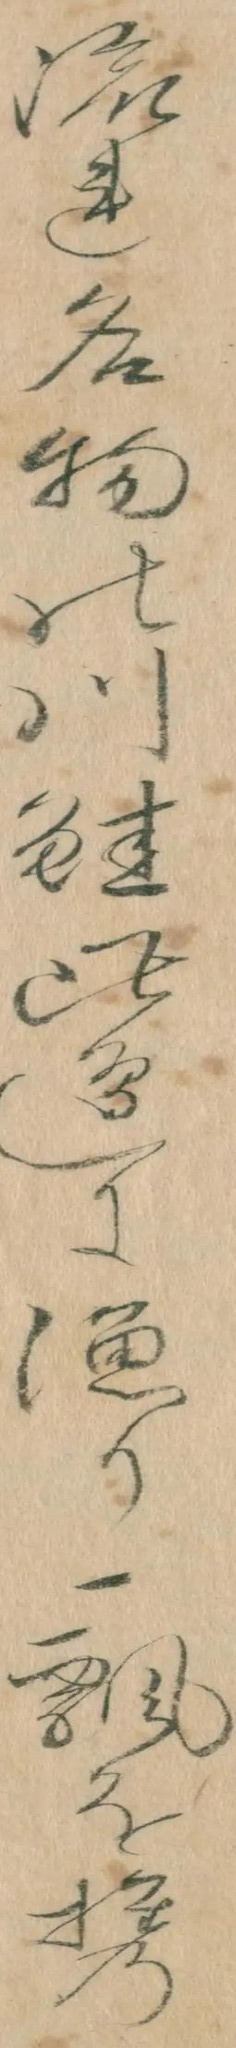流れ名物の川鮭此辺に漁り一瓢をの
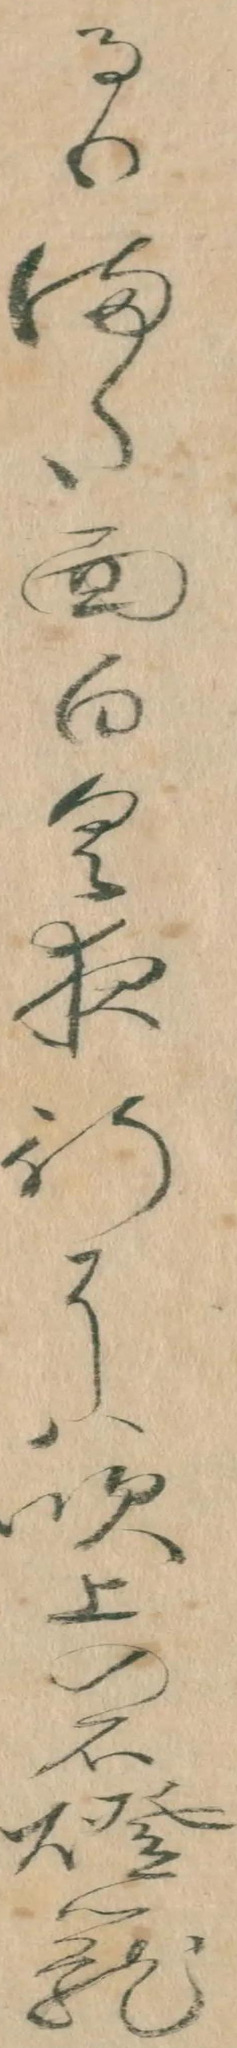るもまた面白く夜行には吹上の石燈籠
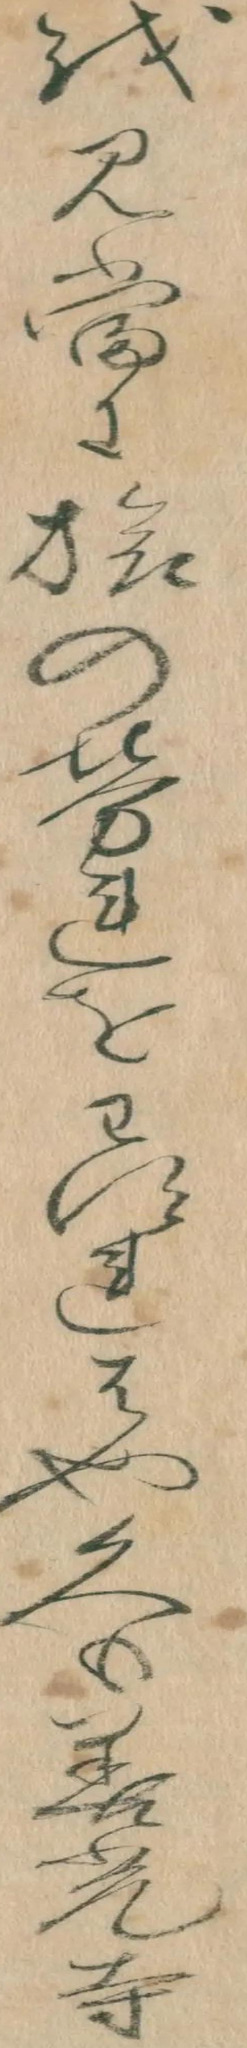を見当に旅の労れをわすれはやくも善光寺
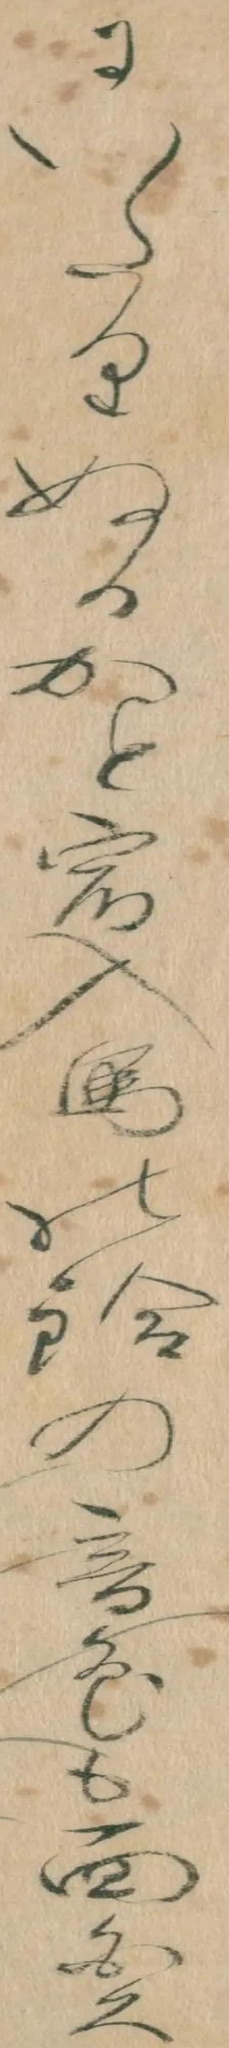にいたりぬるかと宿入馬の鈴の音色も面にく
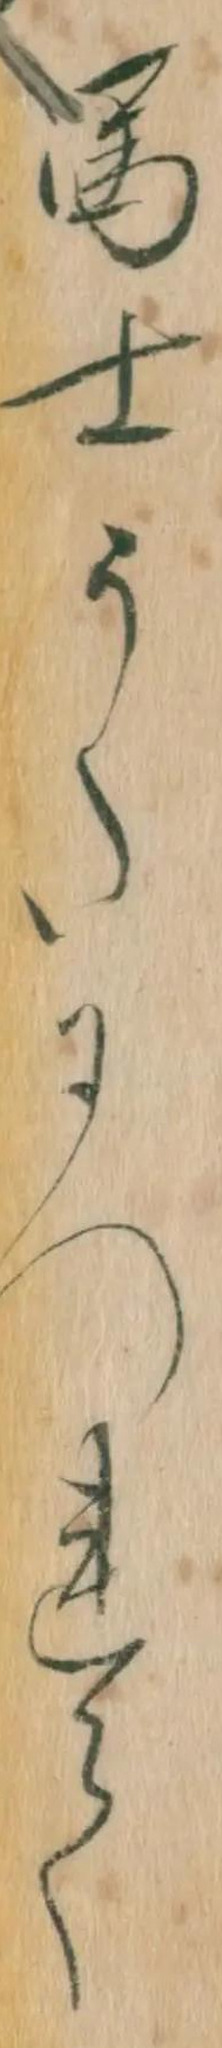馬士うたにつれて
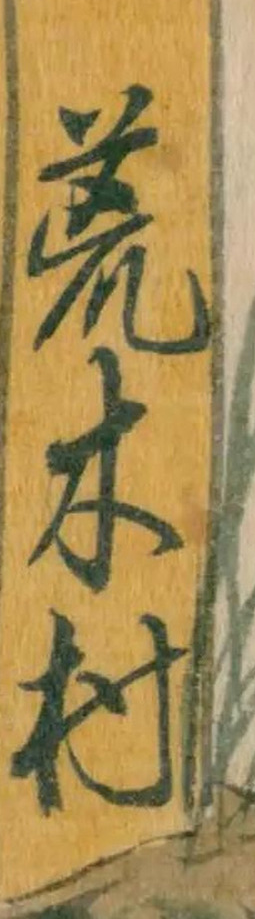荒木村
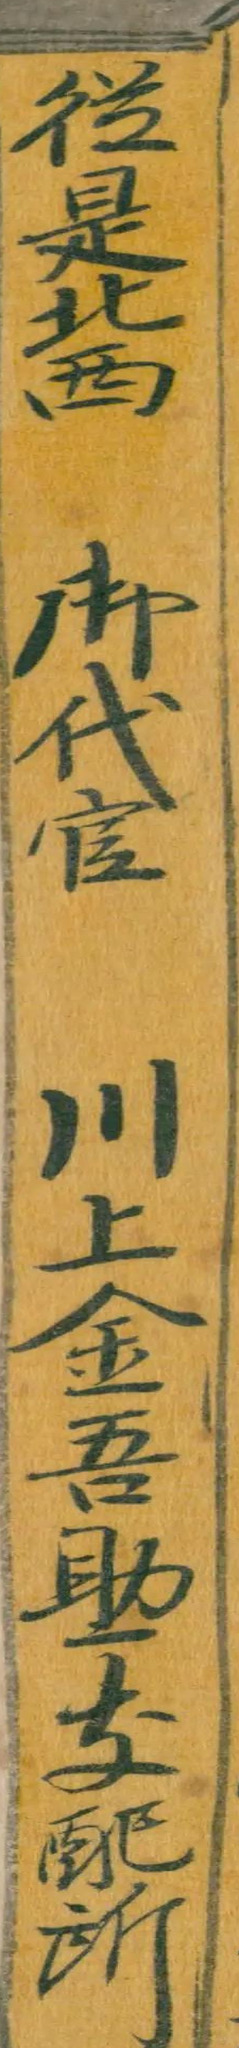従是北西御代官川上金吾助支配所
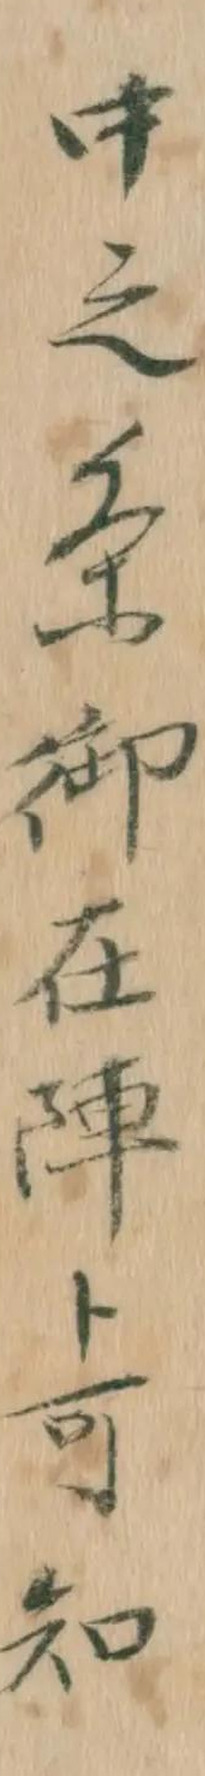中之条御在陣と可知
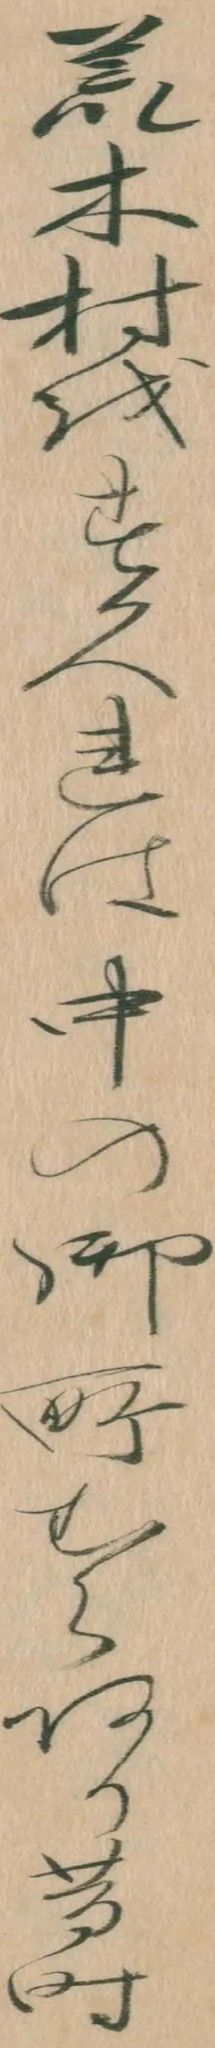荒木村をすくれは中の御所むらあり昔時
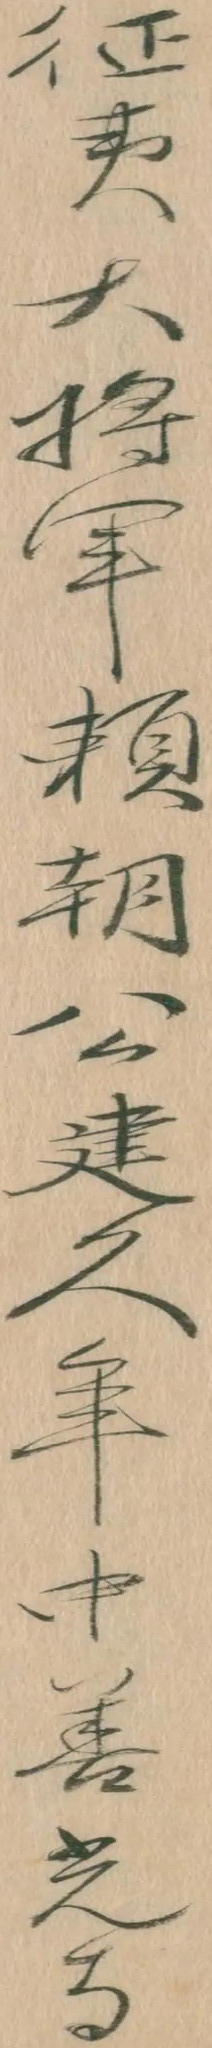征夷大将軍頼朝公建久年中善光寺
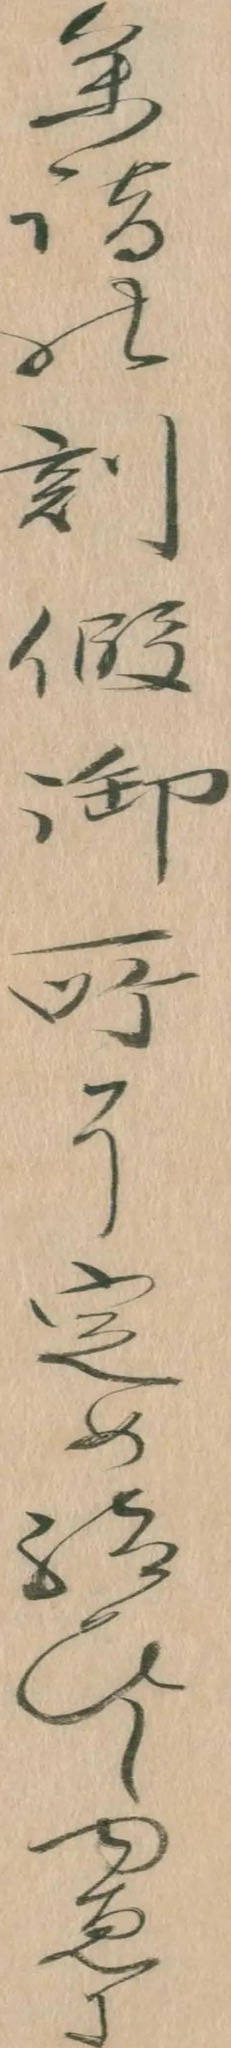参詣の刻仮御所に定め給ひしゆゑに
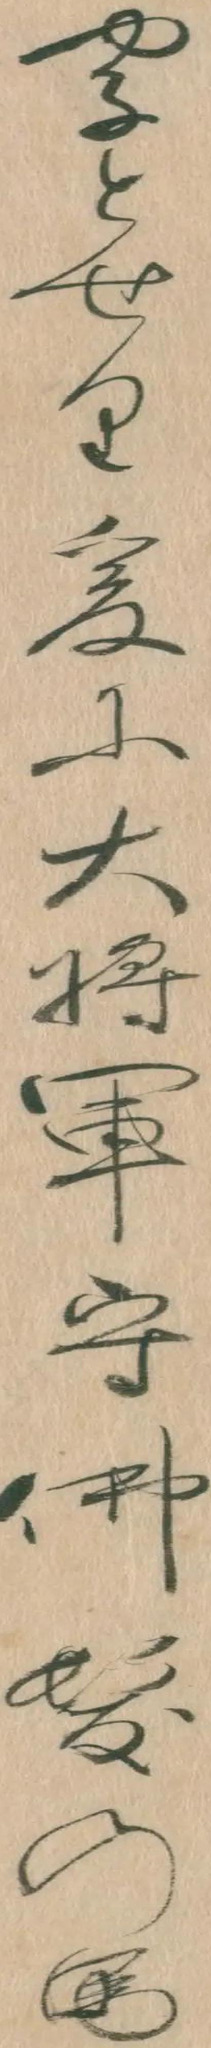字とせり爰に大将軍守仏髪の馬
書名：俗語之種. [1]
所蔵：国立国会図書館 National Diet Library, JAPAN
